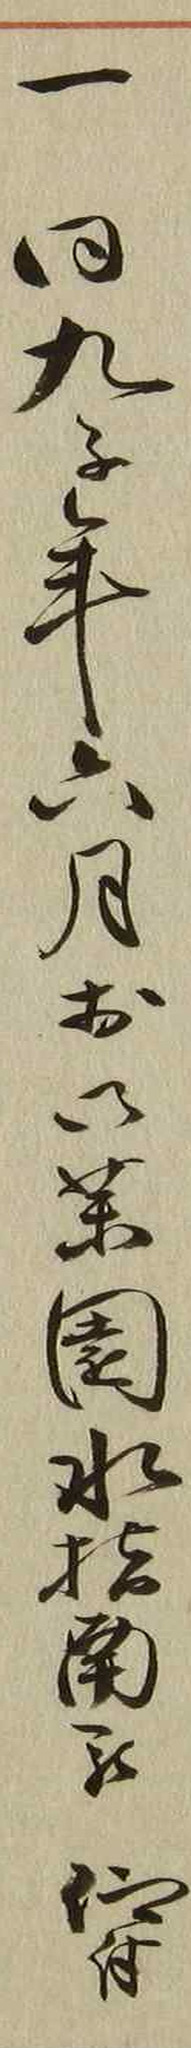一同九子年六月於御茉園水指南被仰付
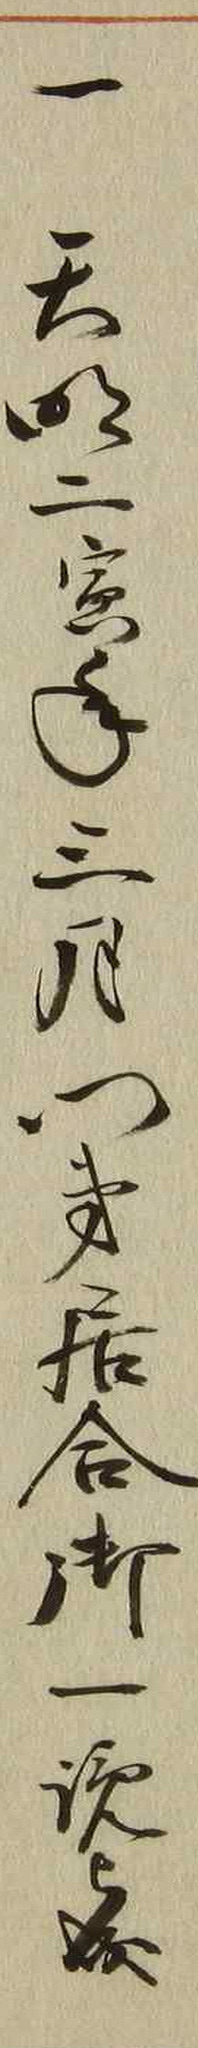一天明二寅年三月門弟居合所一覧被成
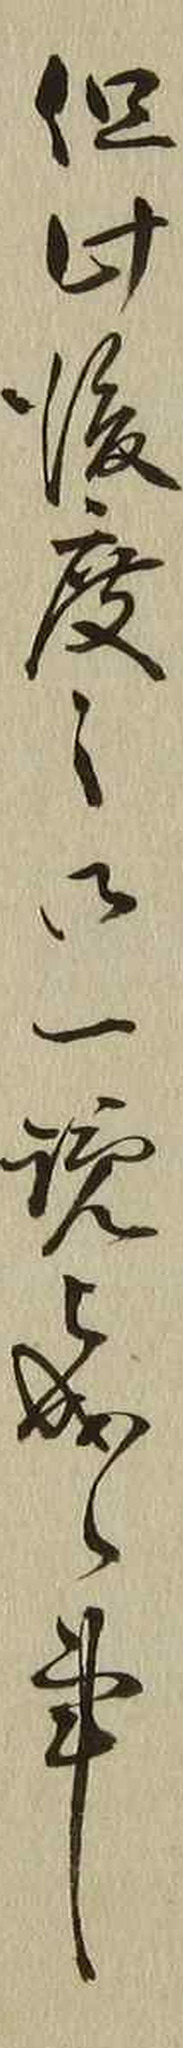但此後度々御一覧被成候事
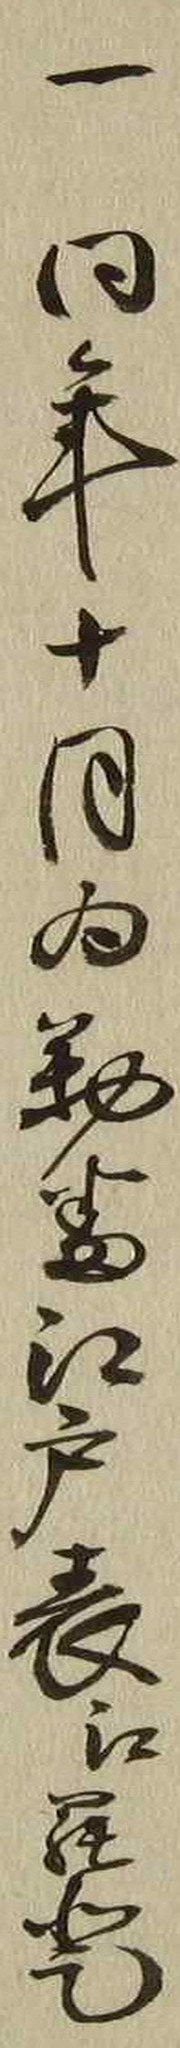一同年十月為勤番江戸表江罷登
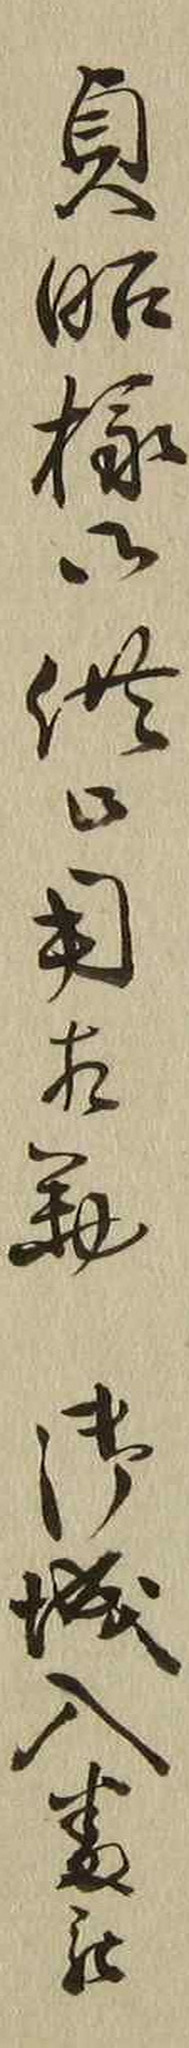貞明様御供御用相勤御城入番被
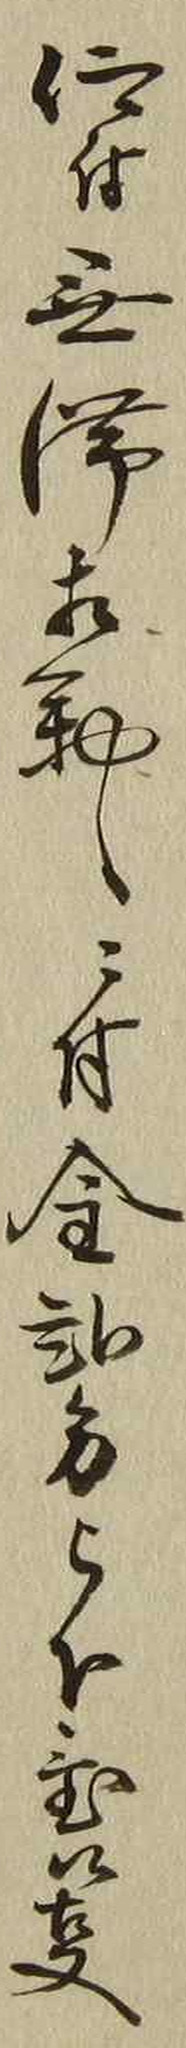仰付無滞相勤候ニ付金弐分被下置候事
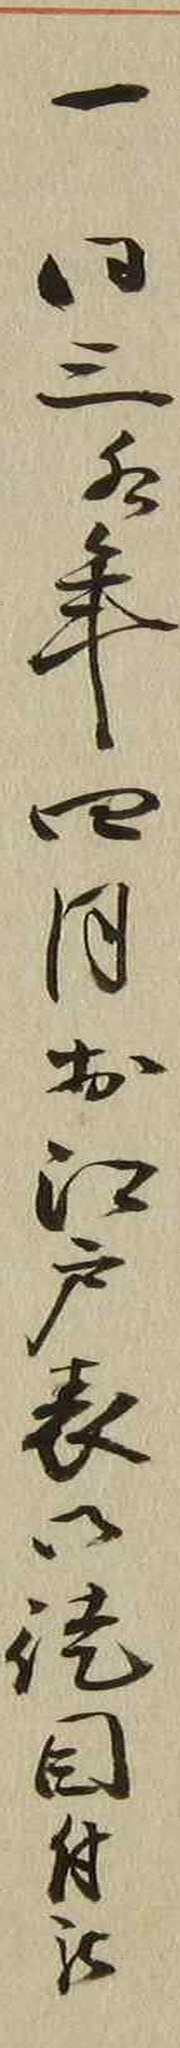一同三卯年四月於江戸表江御徒目付被
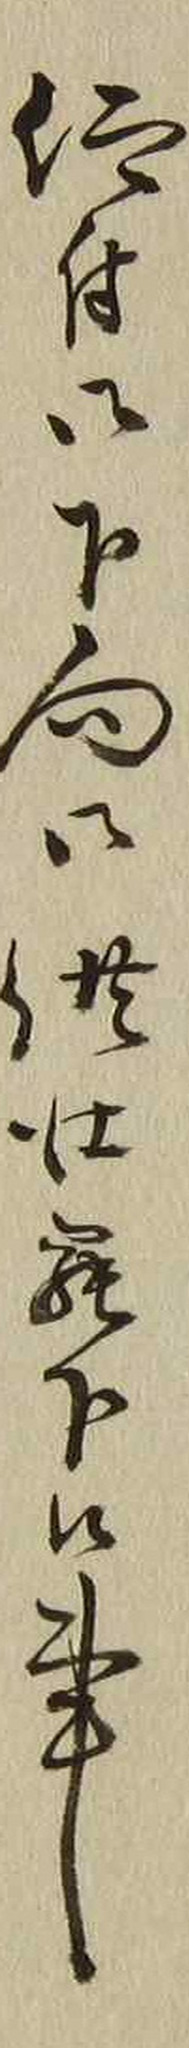仰付御下向御供仕罷下候事
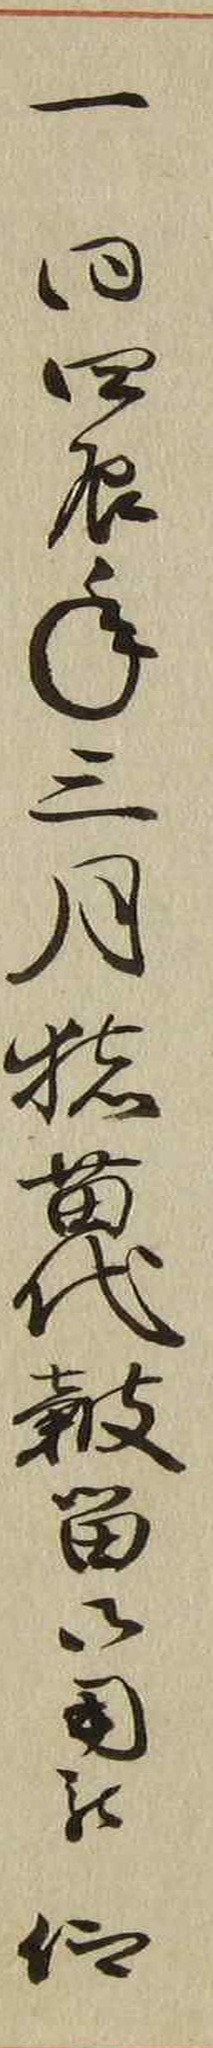一同四辰年三月猪苗代穀留御用被仰
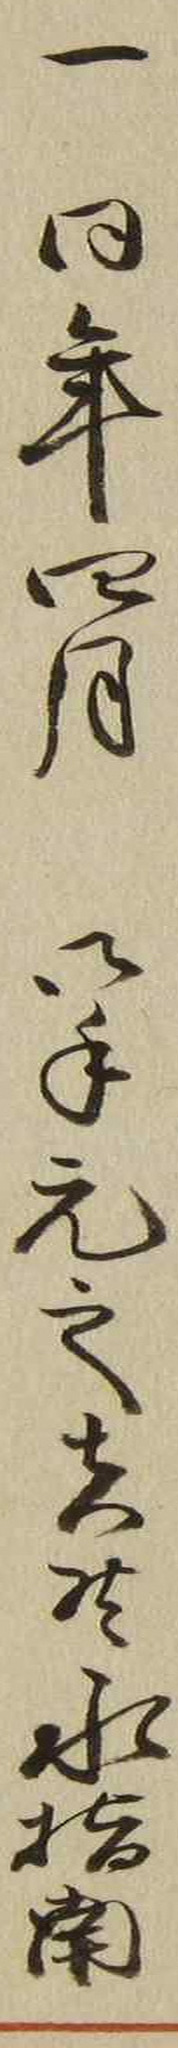一同年四月御手元之者共水指南
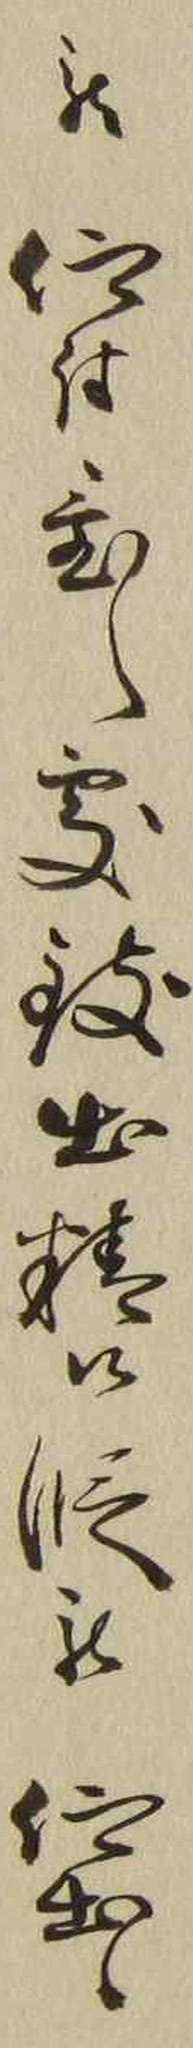被仰付置候處致出精候段被仰出候

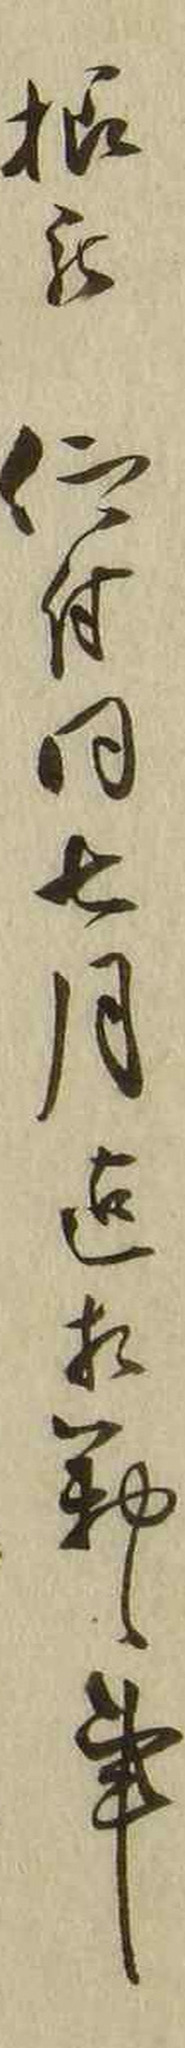様被仰付同七月迄相勤候事
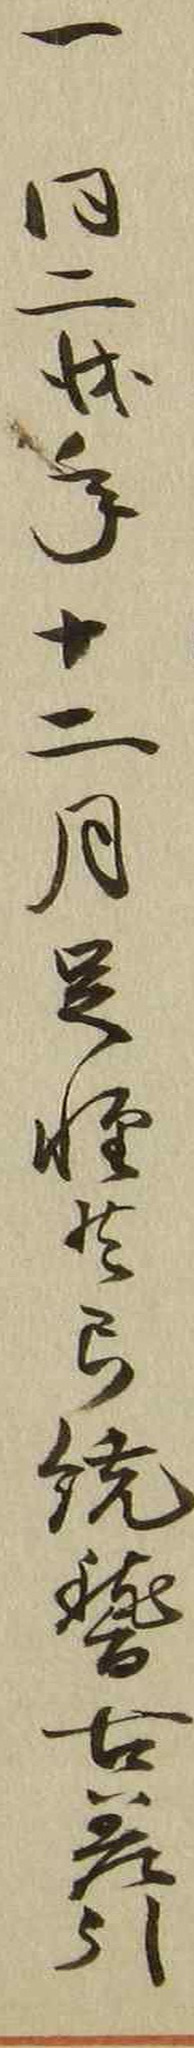一同二戌年十二月足軽共弓銃稽古差引
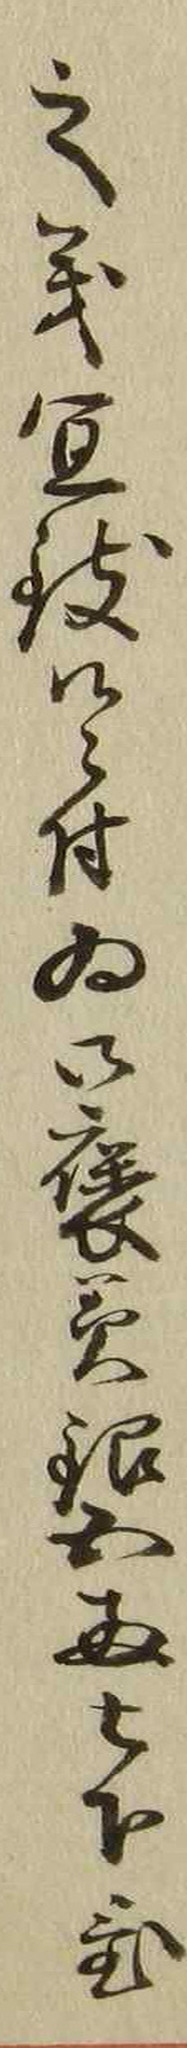之義宜致候ニ付為御褒美銀五両被下置
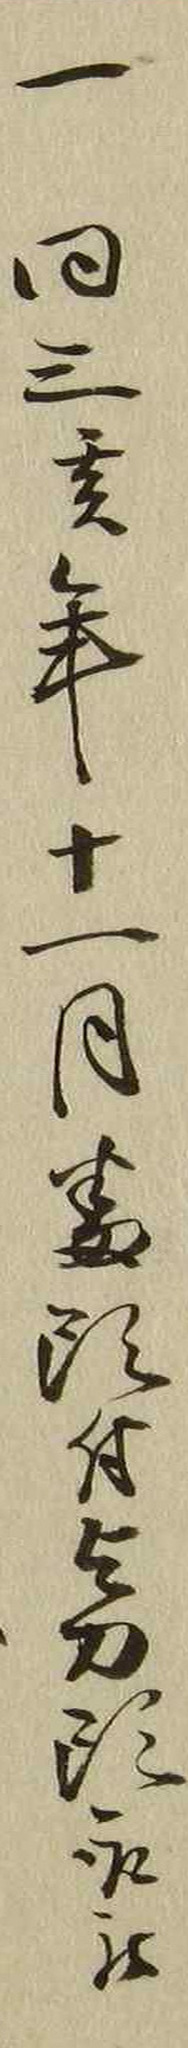一同三亥年十一月番頭付与力頭取被
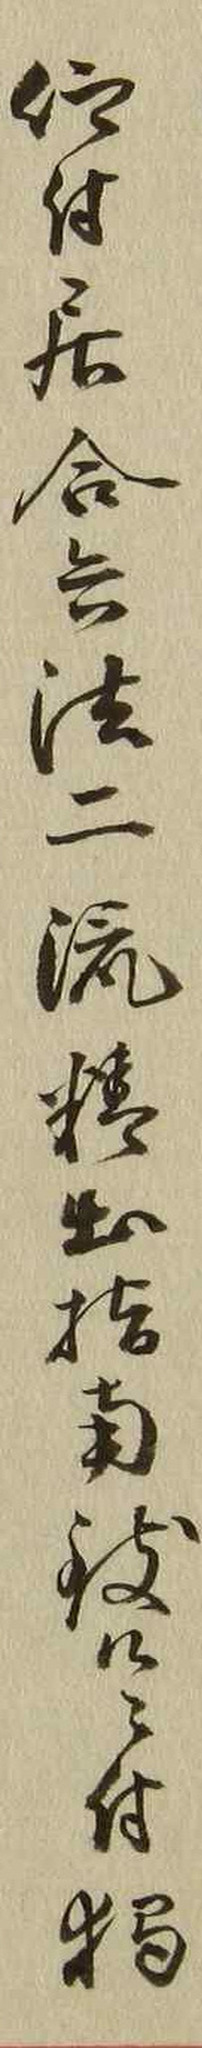仰付居合兵法二流精出指南致候ニ付独
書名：諸士系譜　巻之65　ち之部1
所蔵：会津若松市立会津図書館
